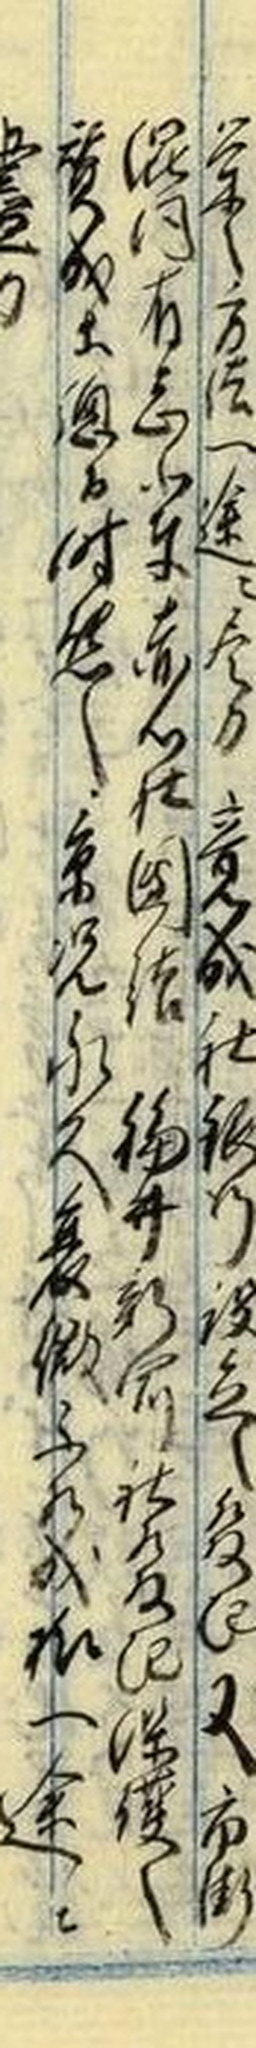賛成等総而時態之景況永久衰微不相成様一途ニ
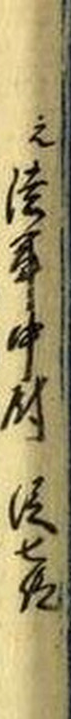元陸軍中尉従七位
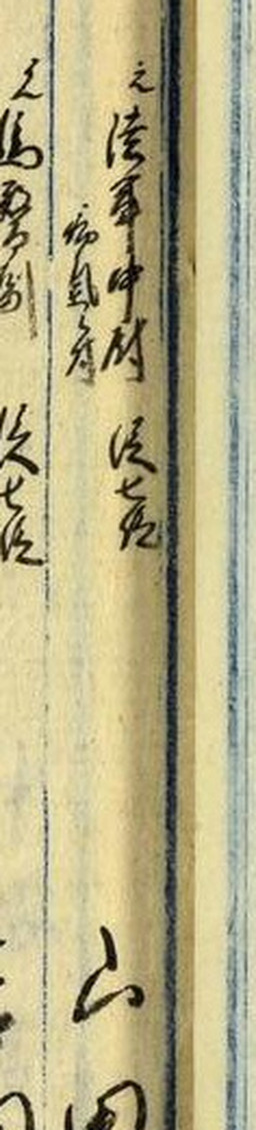元陸軍中尉従七位
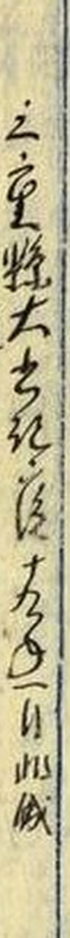三重県大書記官十九年一月非職
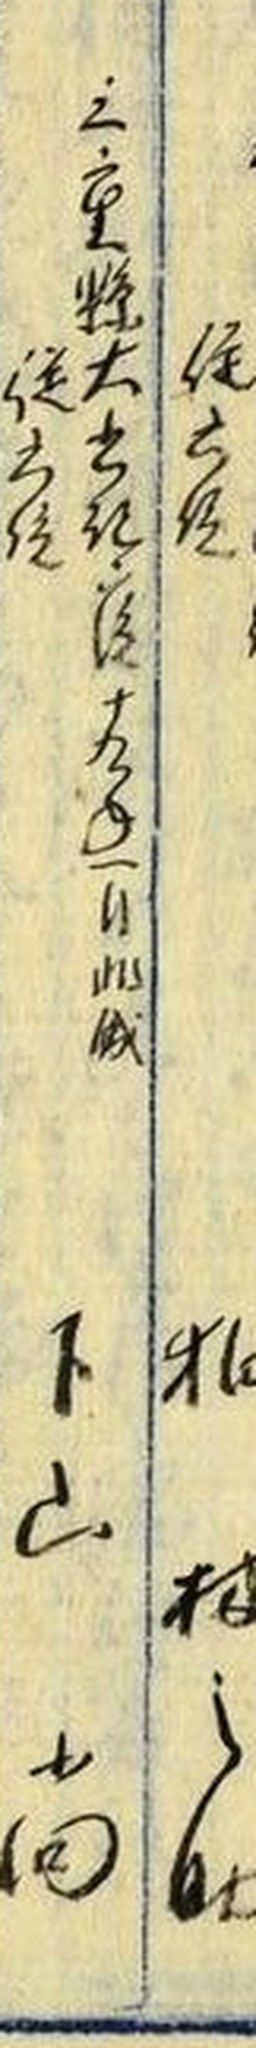三重県大書記官十九年一月非職
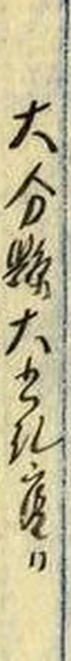大分県大書記官同
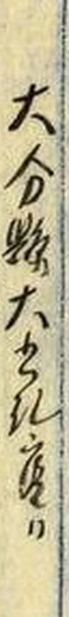大分県大書記官同

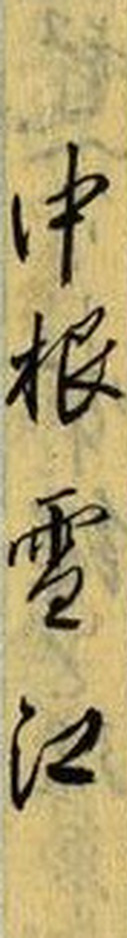中根雪江
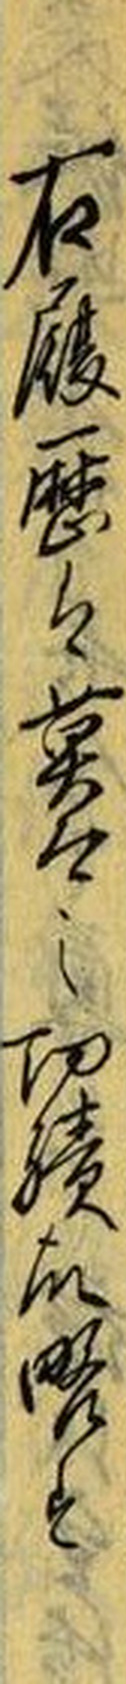右履歴は莫大之功績故略す
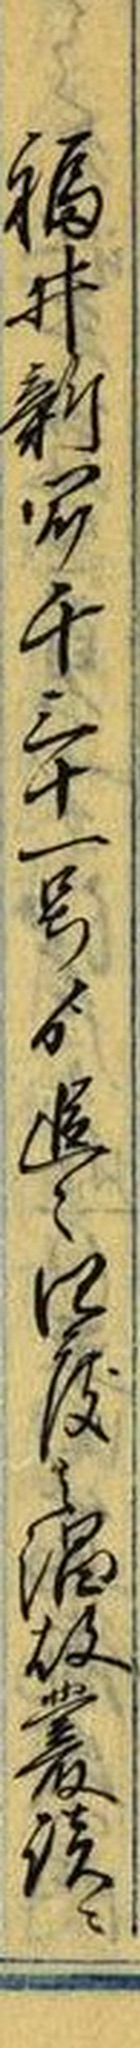福井新聞四千三十一号ゟ追々四度之温故叢談ニ
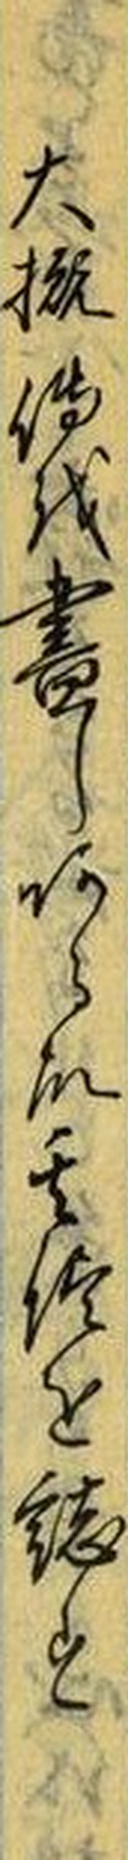大概伝を書しある故其儘を誌す
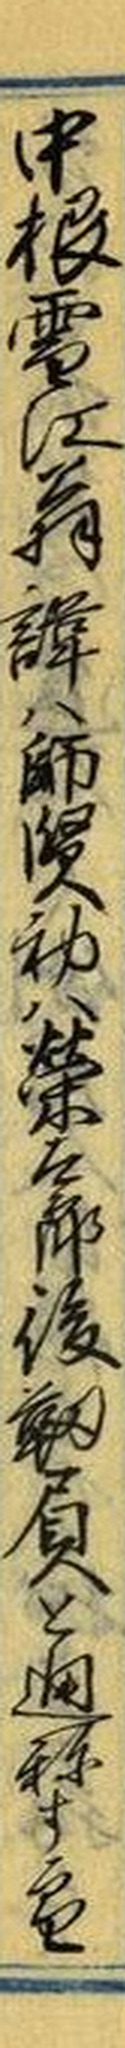中根雪江翁諱ハ師質初ハ栄太郎後靱負と通称す雪
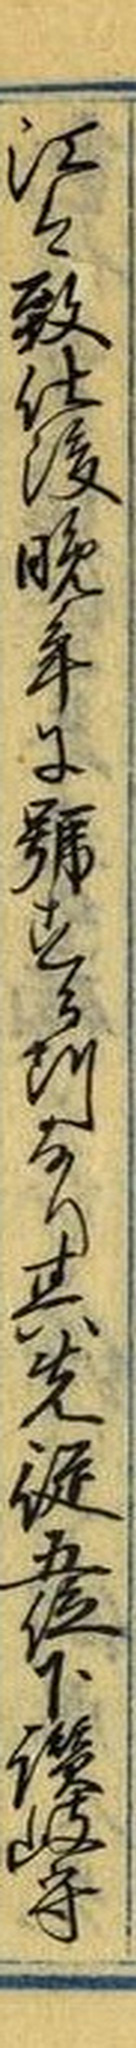江は致仕後晩年に号する所なり其先従五位下讃岐守
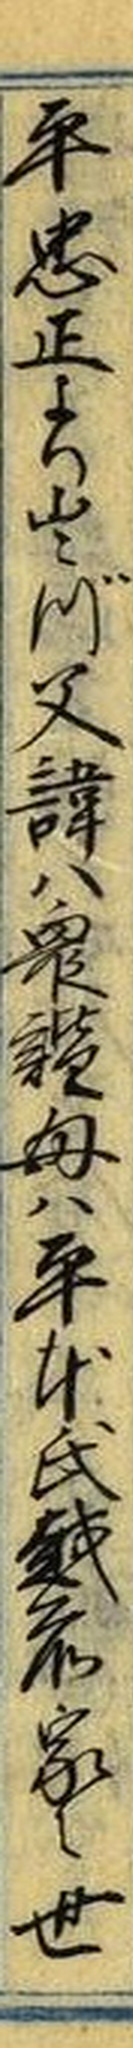平忠正ゟ出ず父諱ハ衆諧母ハ平本氏越前家之世
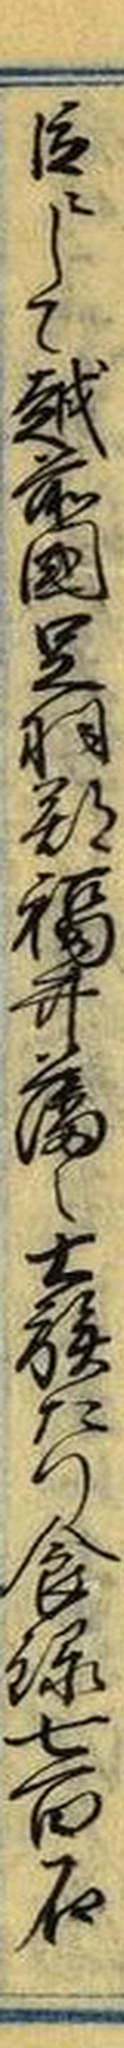臣ニして越前国足羽郡福井藩之士族たり食録七百石
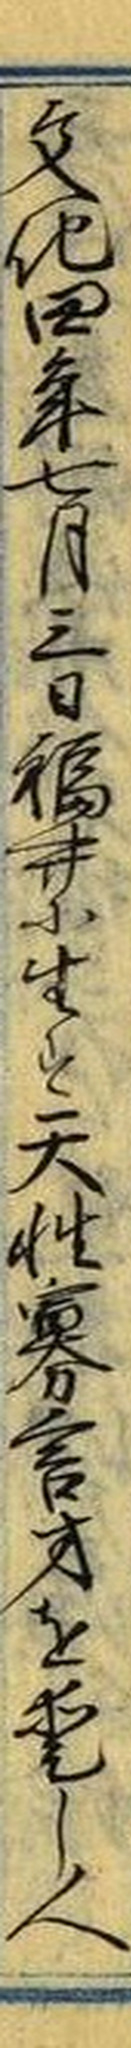文化四年七月三日福井に生す天性寡言方を愛し人
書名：温古集 三巻
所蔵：福井県文書館 Fukui Prefectural Archives
